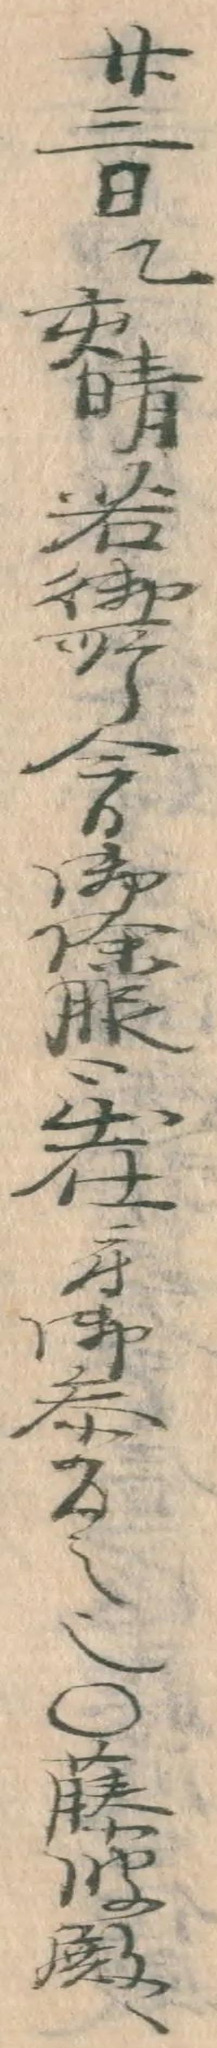廿三日乙亥晴若御所今日御除服御出仕ニ付御参有之也○藤波殿へ
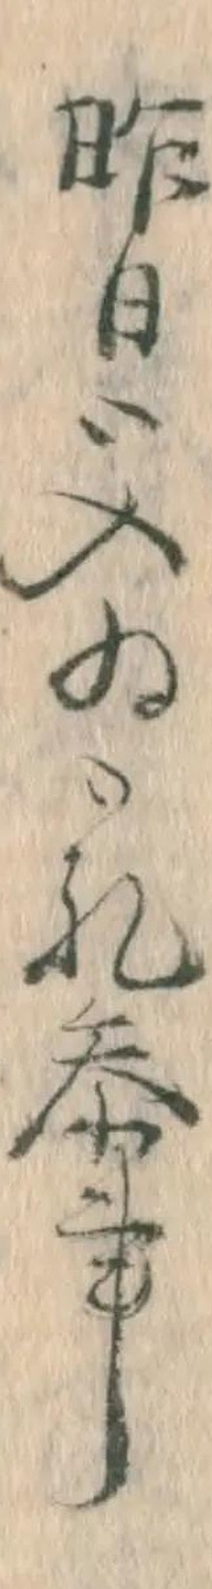昨日御入為御礼参事
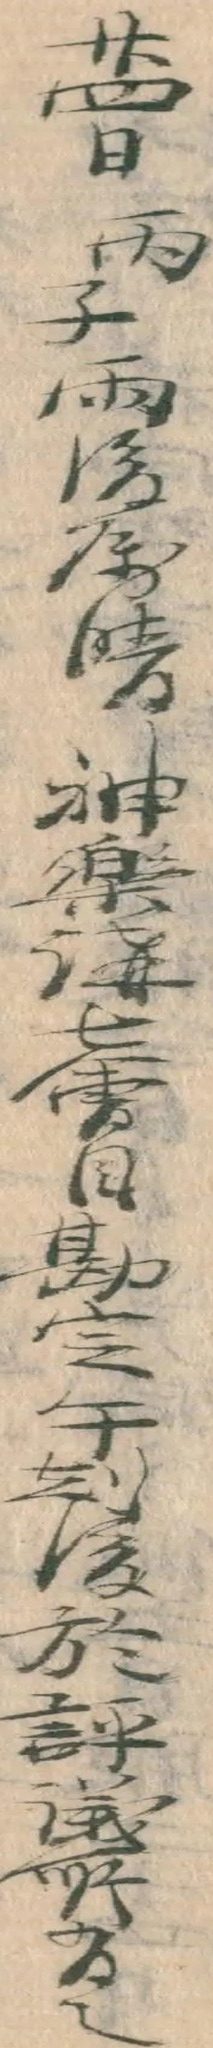廿四日丙子雨後属晴神楽講七會目勘定午刻後於評議所有之
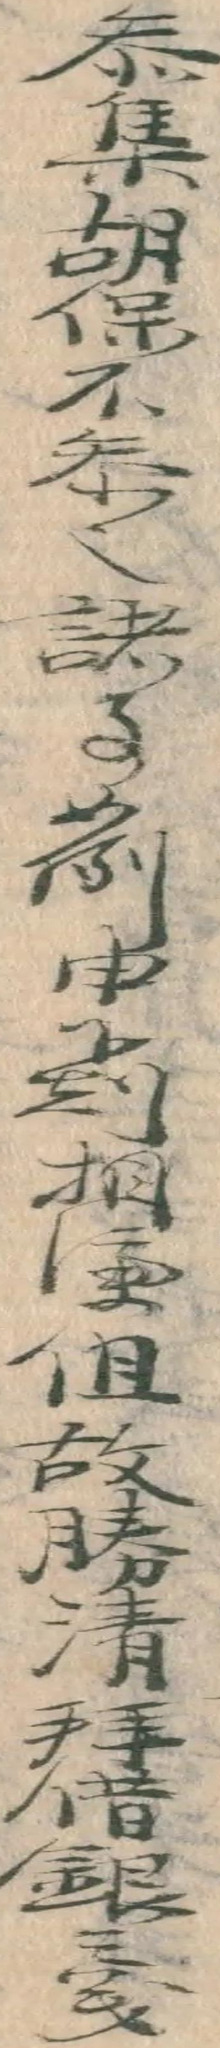参集胡保不参也諸事如例申下刻相済但故勝清拝借銀之義
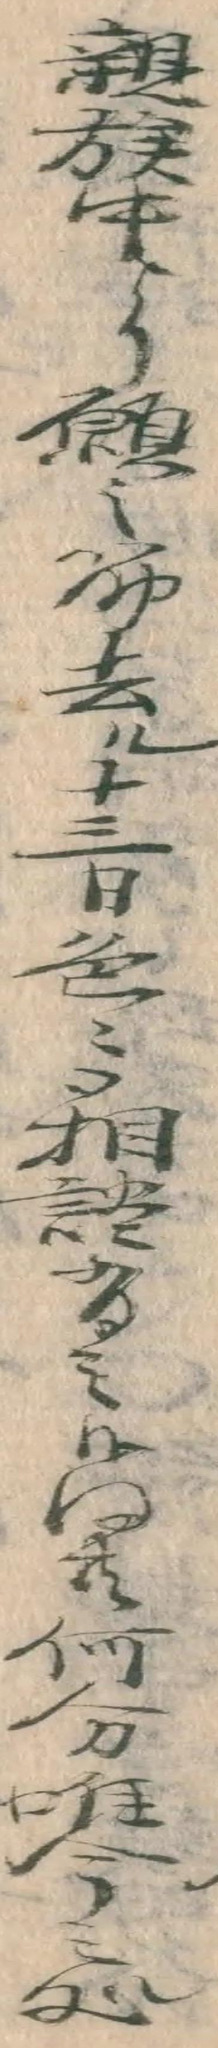親族中より願之筋去ル十三日色々御相談有之候得共何分唯今之処
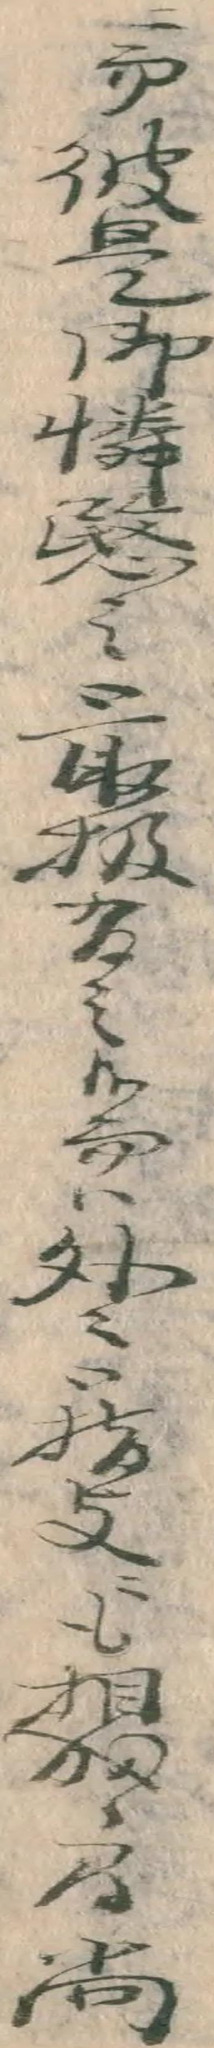ニ而彼是御憐愍之御取扱有之候而ハ外ニ御指支ニも相成候間尚
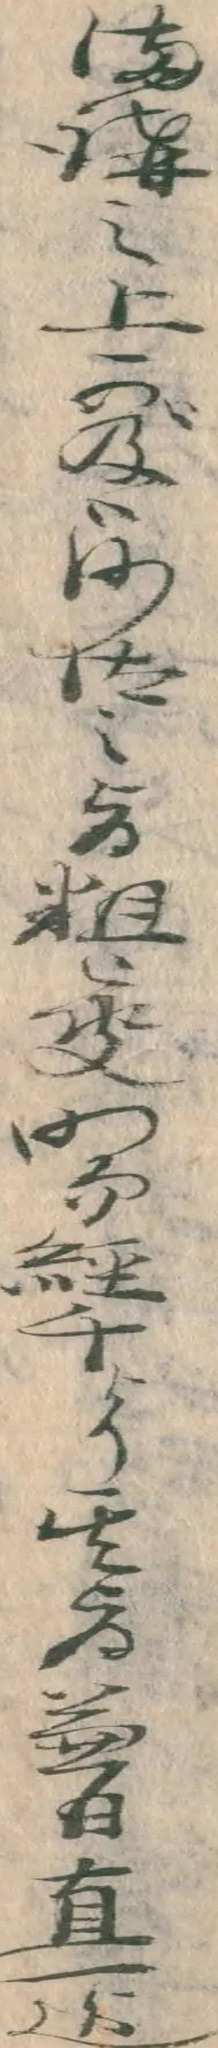満講之上可及御沙汰之旨粗被決仍而経千より其旨兼日直一迄
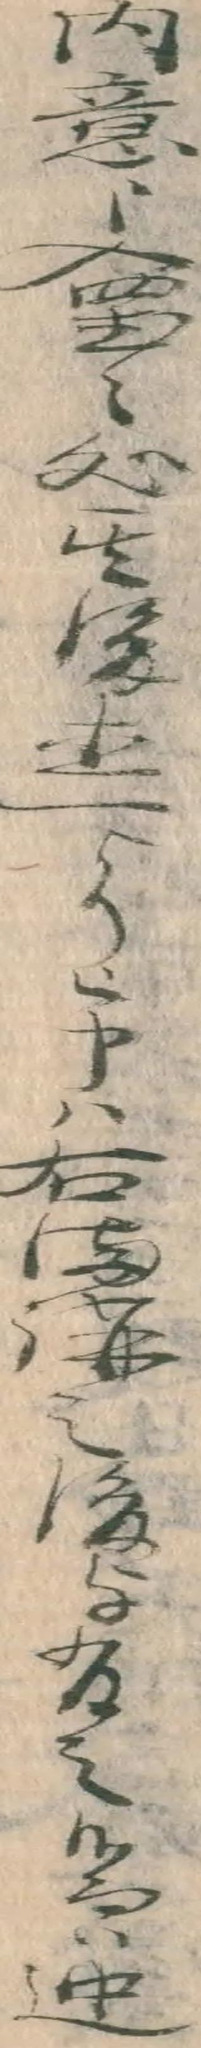内意申入置候処其後直一より被申は右満講之後与有之候而ハ迚
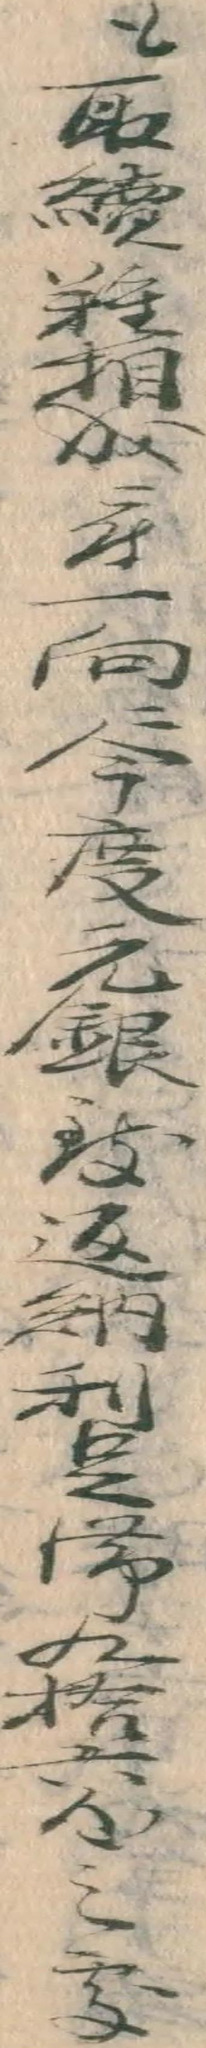も取續難相成ニ付一向ニ今度元銀致返納利足滞九拾六匁之處
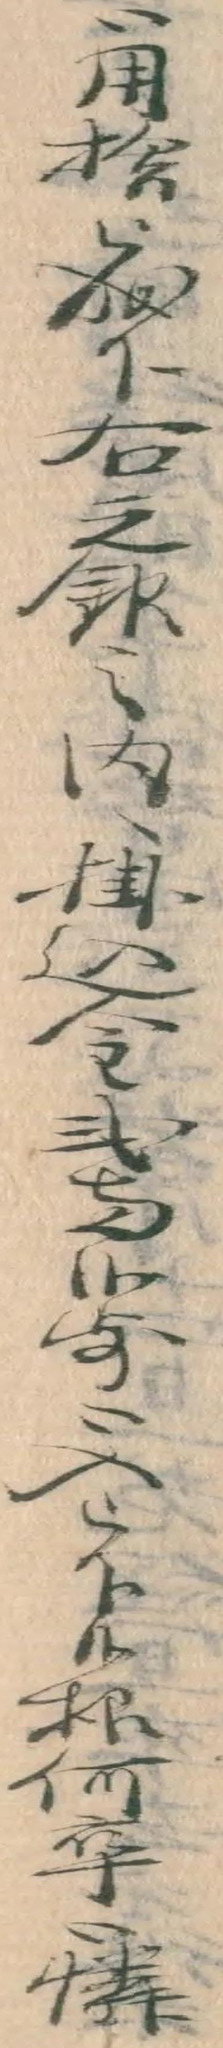御用捨被成下右元銀之内へ掛込金弐両弐歩御入被下候様何卒御憐
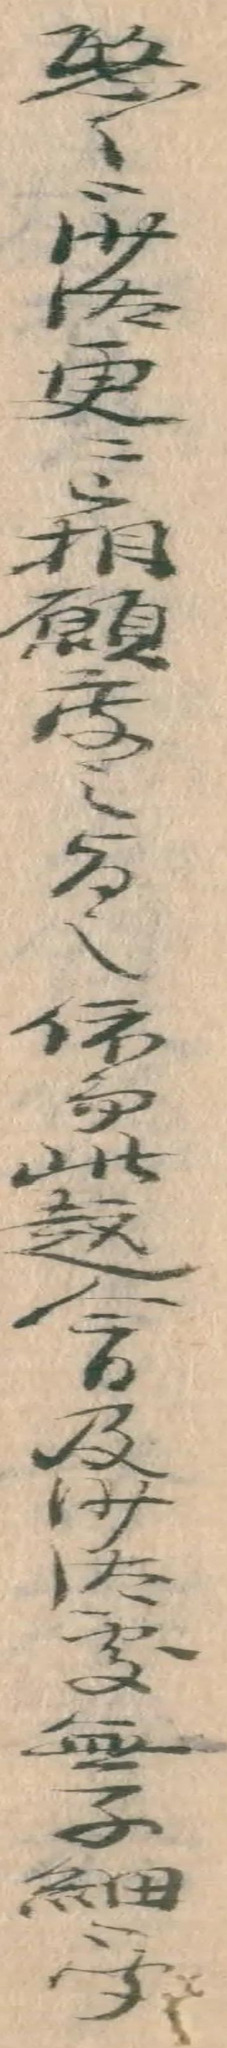恐々御沙汰更ニ被相願度之旨也依而此趣今日及沙汰處無子細御聞
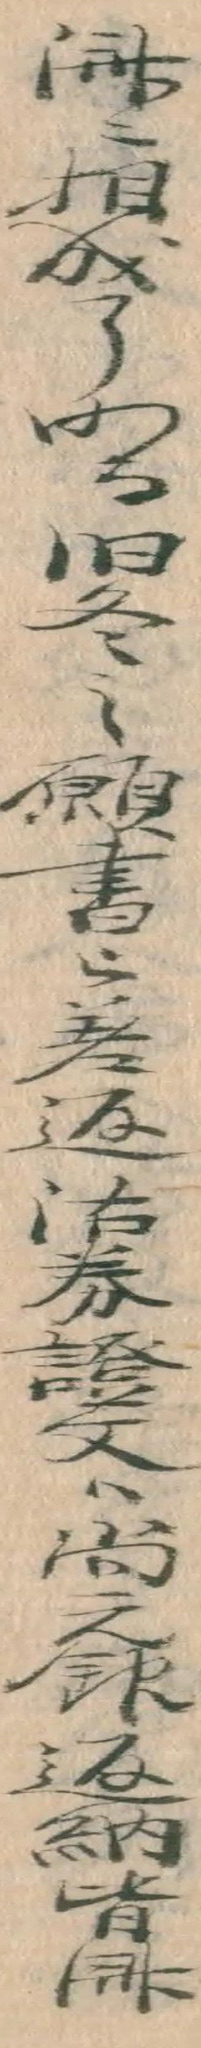済ニ相成了仍而旧冬之願書被差返沽券證文ハ尚元銀返納皆済
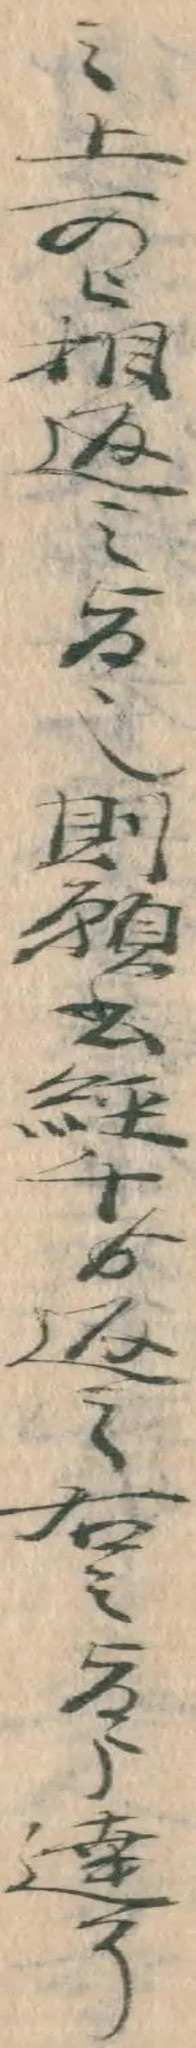之上可被相返之旨也則願書経千ゟ返之右之旨申達候
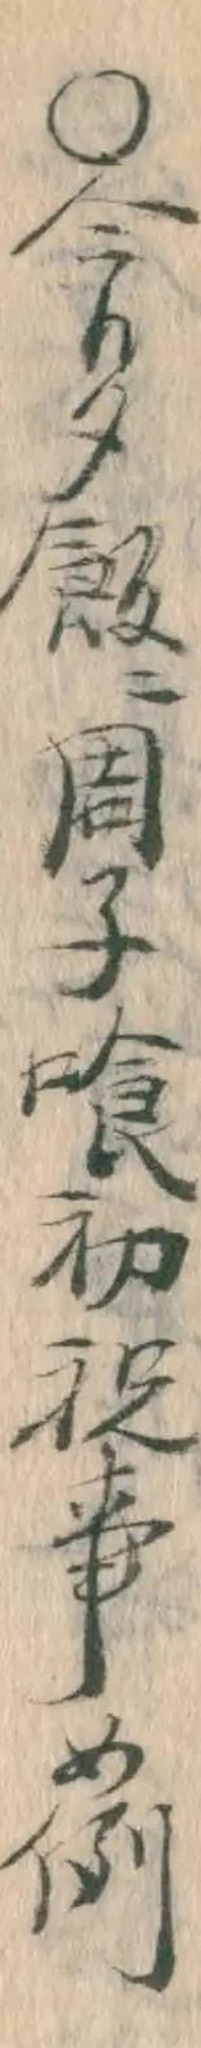○今日夕飯ニ周子喰初祝事如例
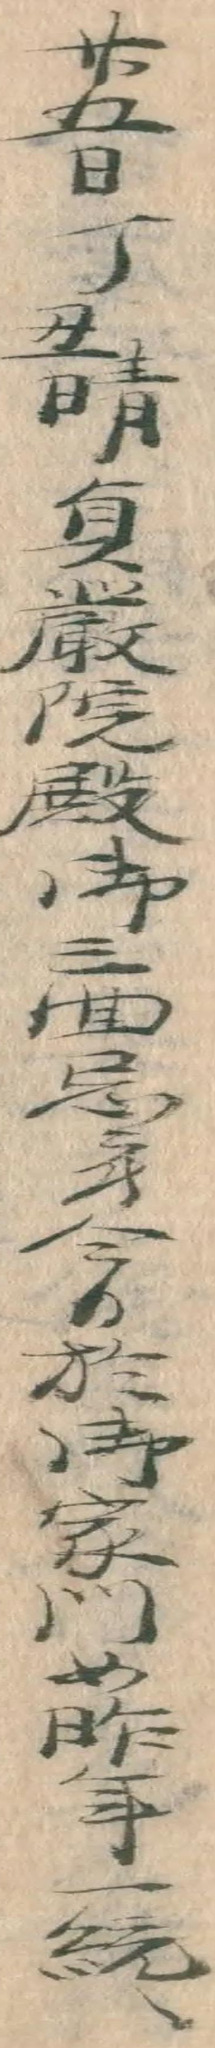廿五日丁丑晴貞厳院殿御三回忌ニ付今日於御家門如昨年一統へ
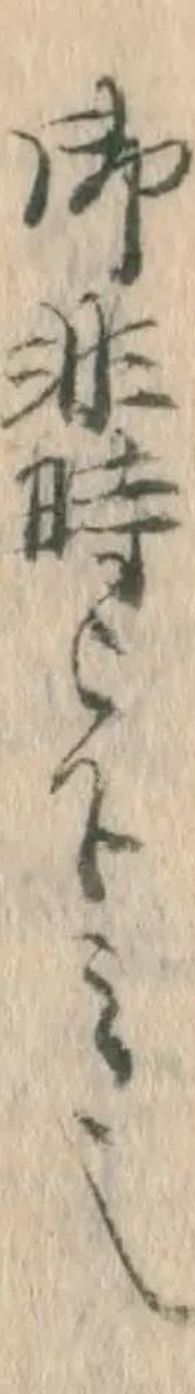御非時被下之也
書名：賀茂社記録. 第65冊
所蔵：国立国会図書館 National Diet Library, JAPAN
